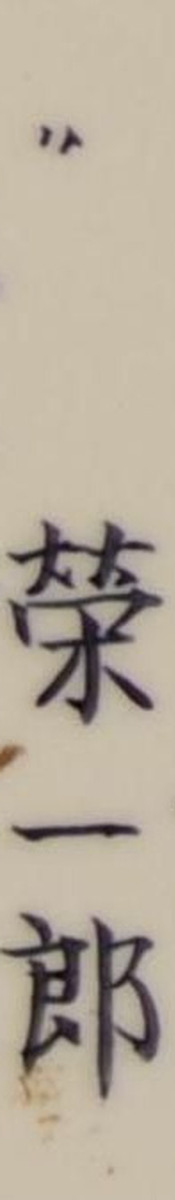榮一郎
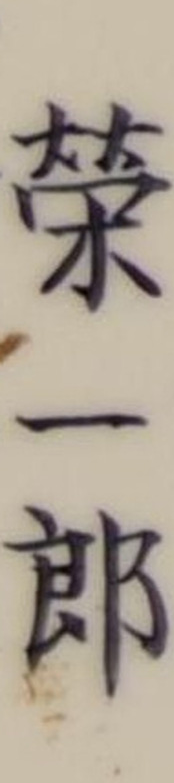榮一郎
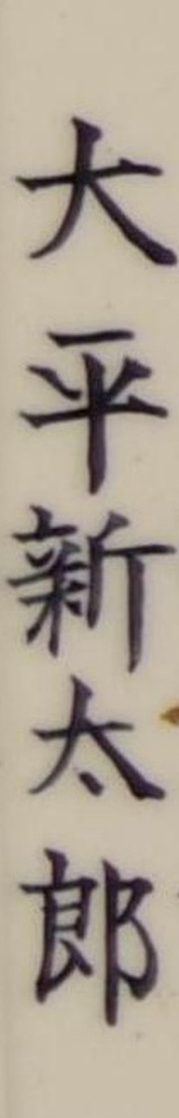大平新太郎

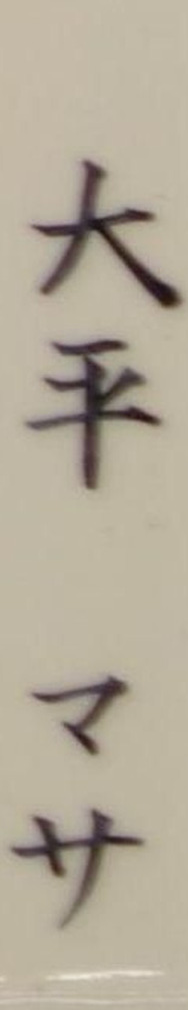大平マサ
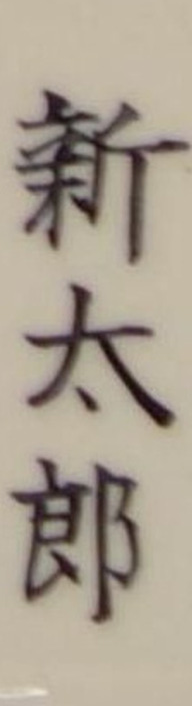新太郎
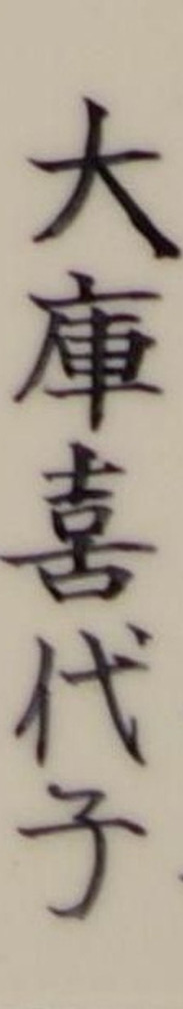大庫喜代子
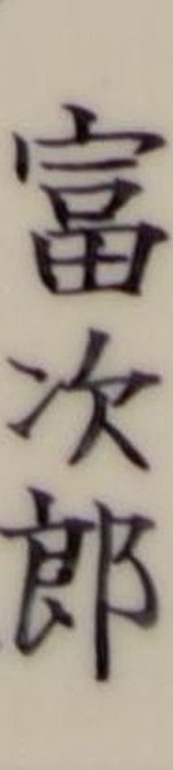富次郎
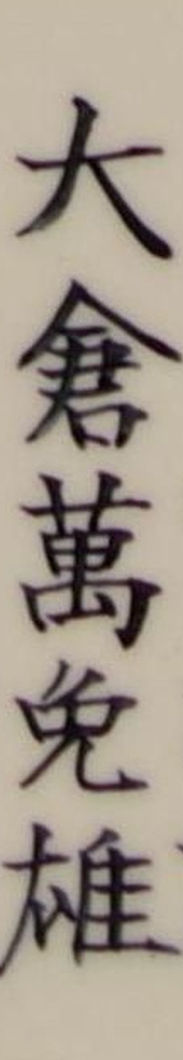大倉萬免雄
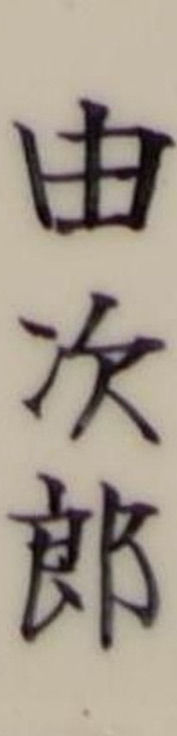由次郎
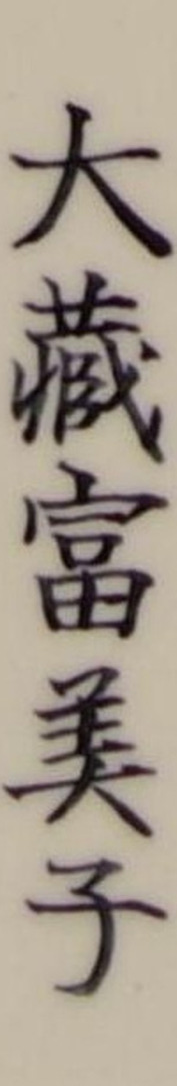大蔵富美子
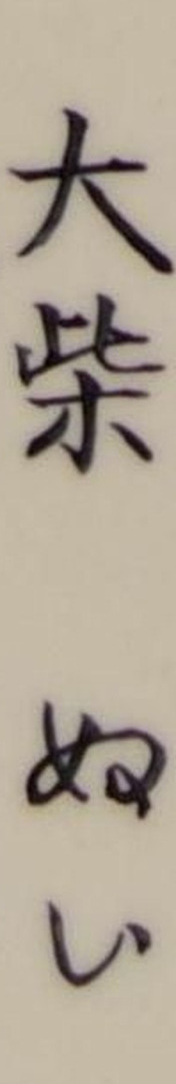大柴ぬい
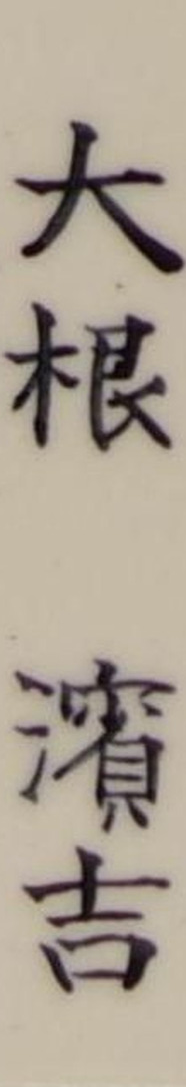大根濱吉
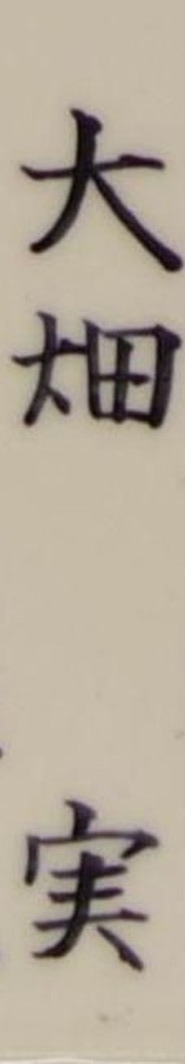大畑実
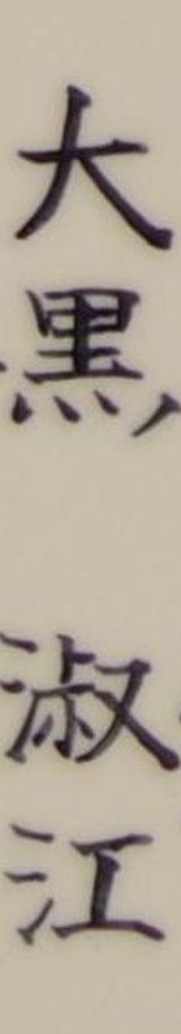大黒淑江
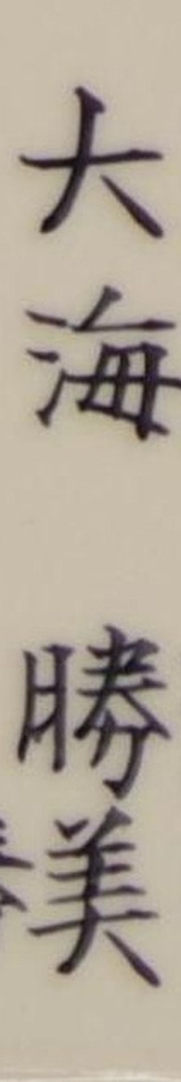大海勝美
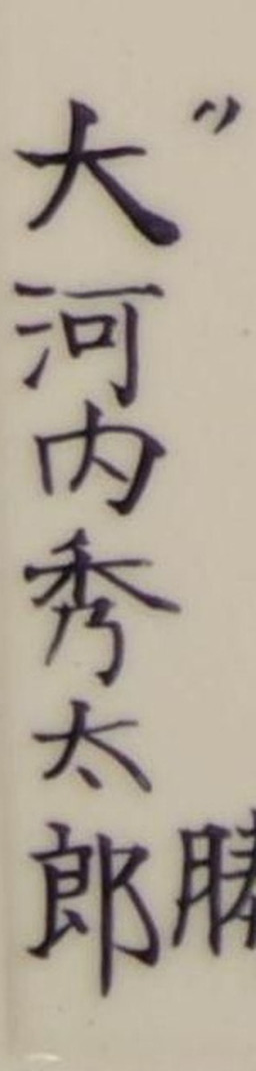大河内秀太郎
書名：M~S
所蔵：高野山金剛峯寺
